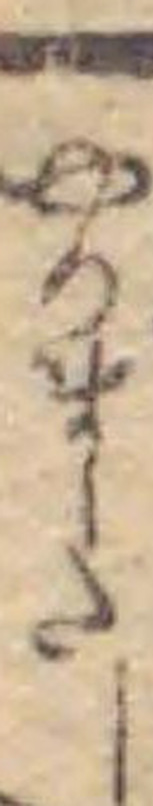やりました
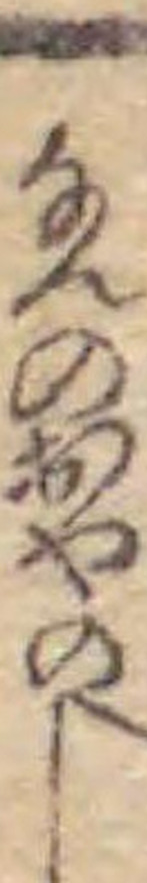なんのおやの
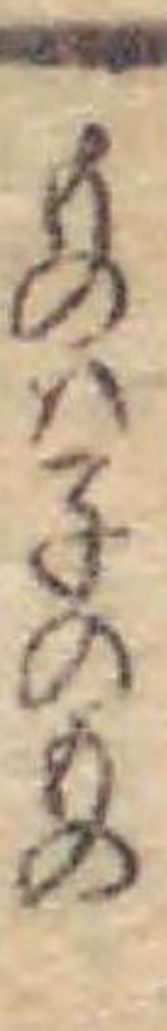ものは子のもの
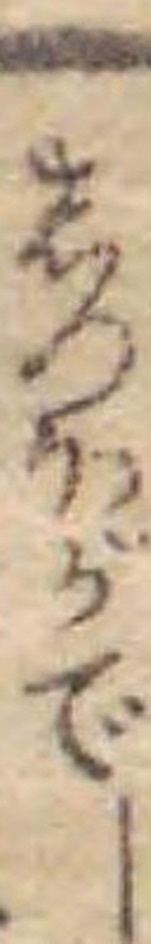しつほがで
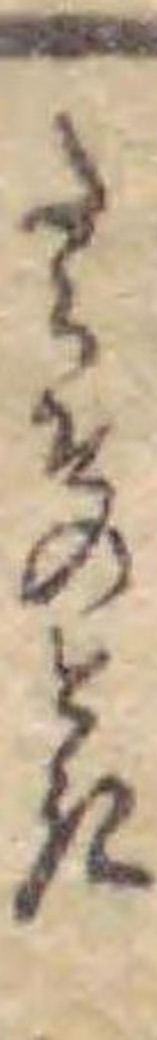たらそのとき
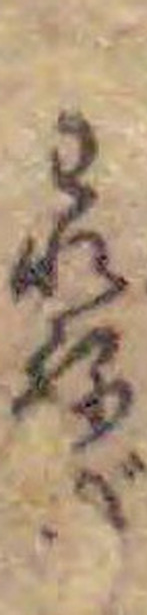われねば
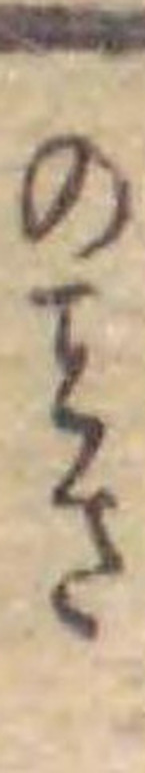のことさ
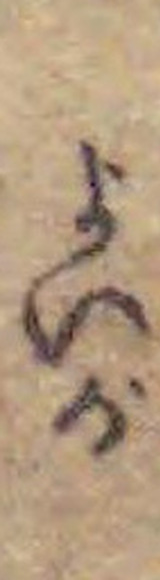よいが

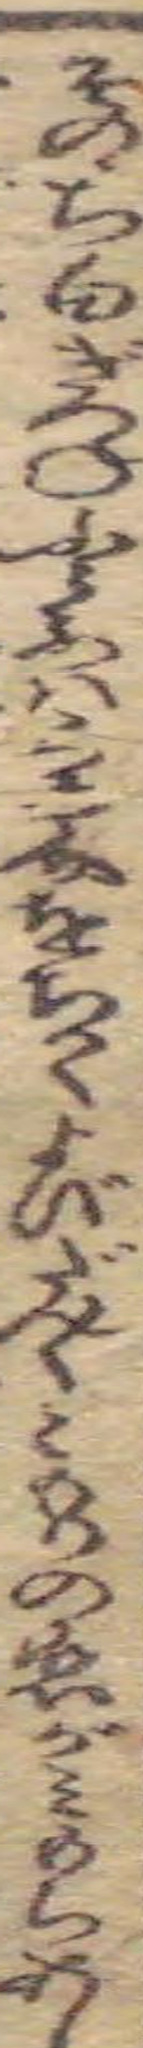そのゝち白ぎつねふうふはくろ介をちかくよびだん〳〵ともりの丞がみもちあし
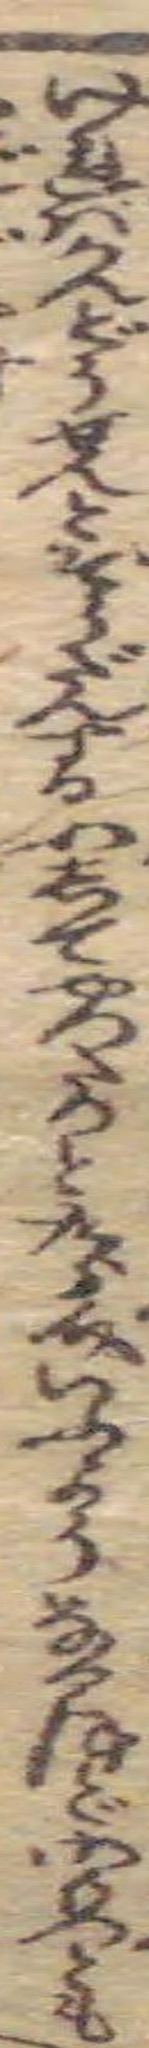ければかんどうせんとそうだんするにしてやつたりと九郎介いふようなるほど御もつとも
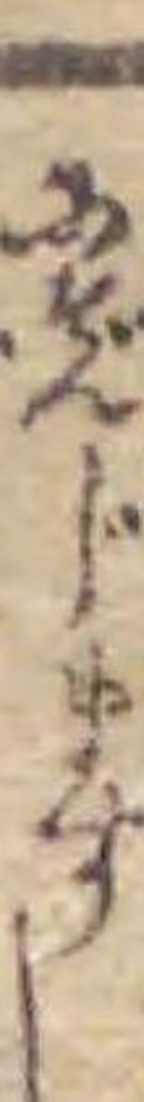にぞんじます
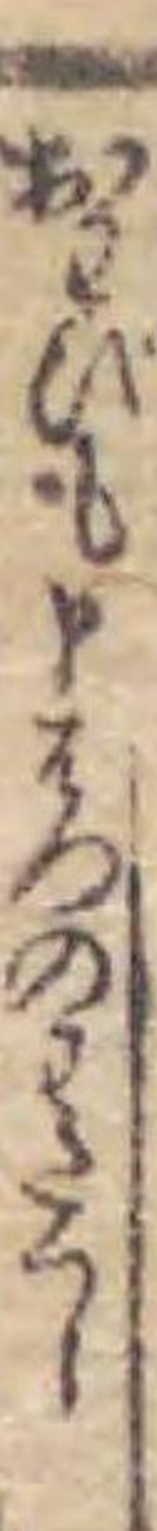おわびも申はつのわたくし
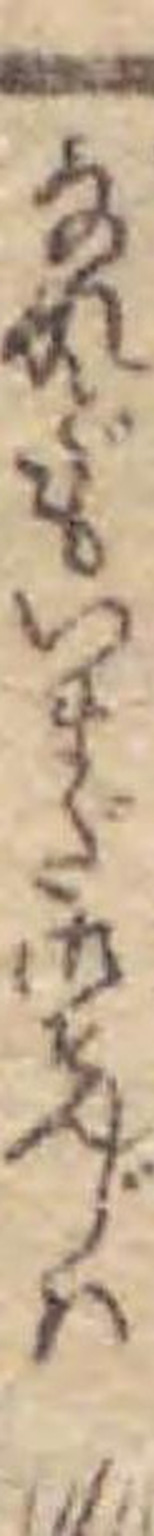なれどもいまだ御そんじは
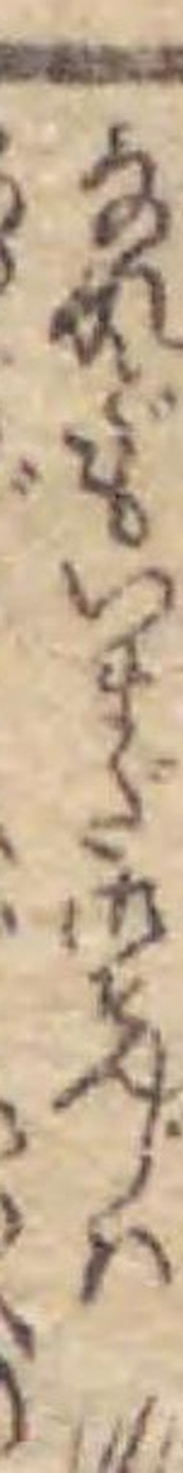なれどもいまだ御そんじは
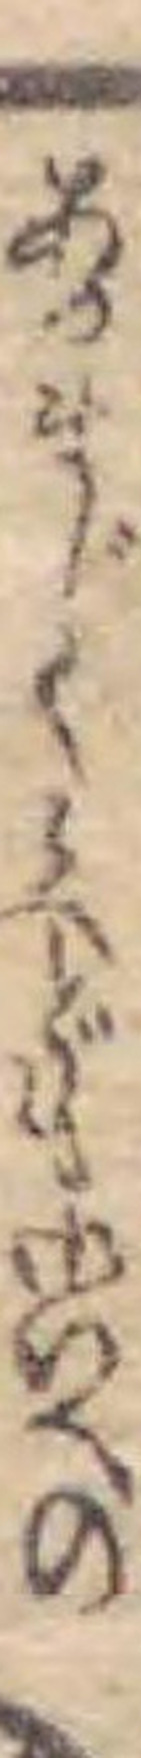あるまじく候へども御いへの
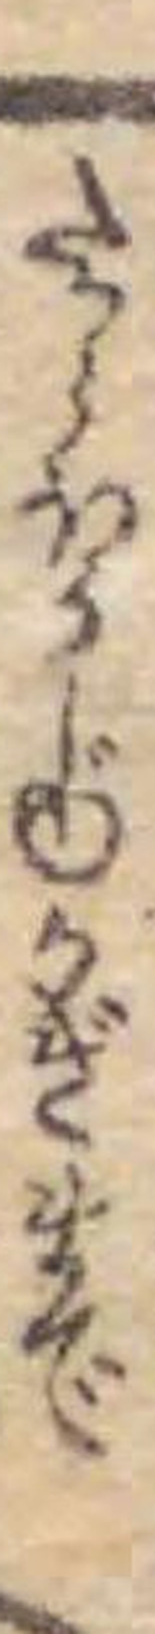たからほうじゆかぎまで
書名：扨化狐通人 : 2巻
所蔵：国立国会図書館 National Diet Library, JAPAN
